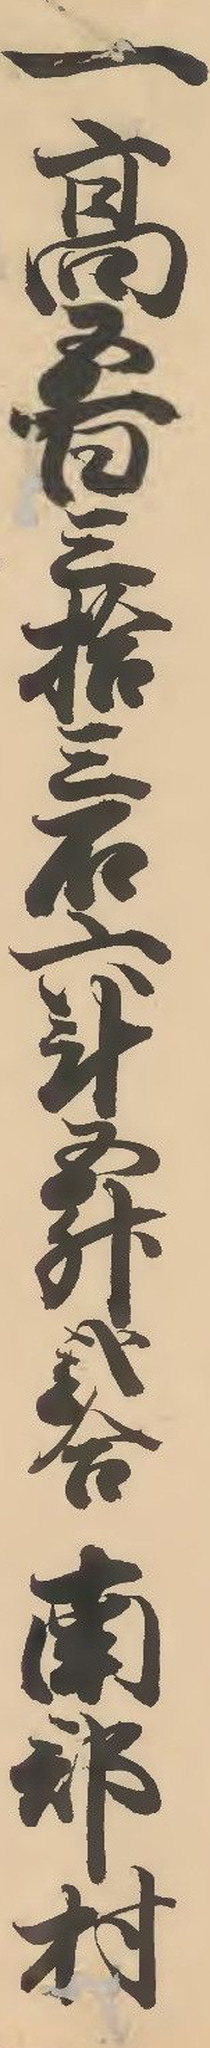一高五百三拾三石六斗五升弐合南部村
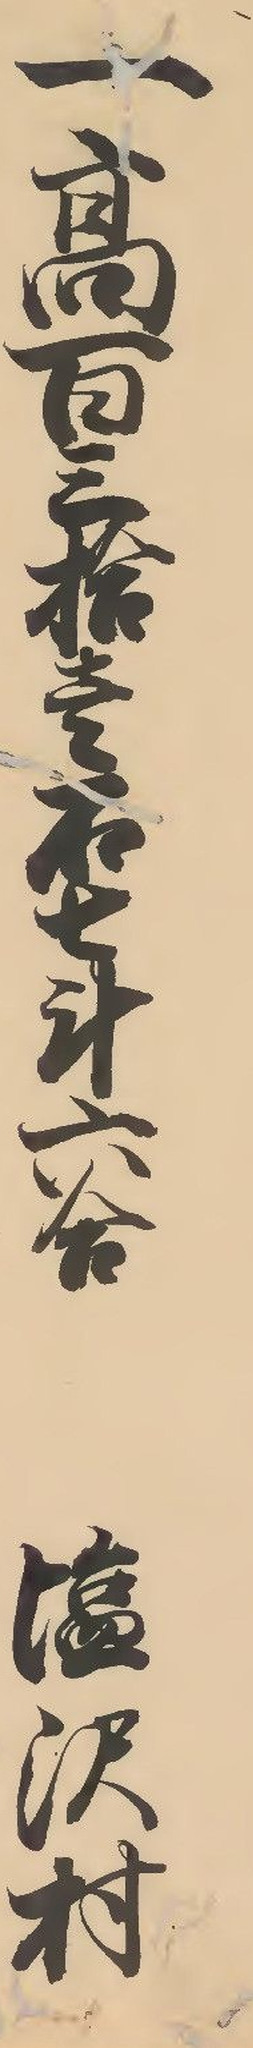一高百三拾壱石七斗六合塩沢村
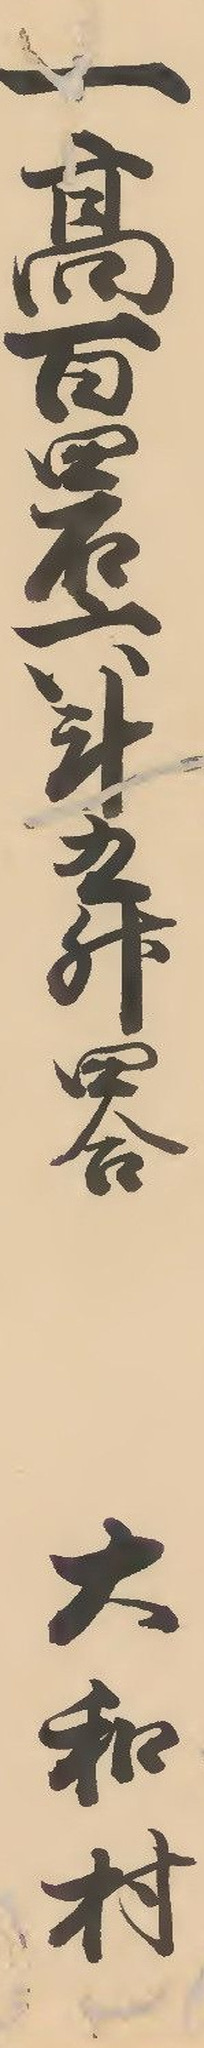一高百四石六斗九升四合大和村
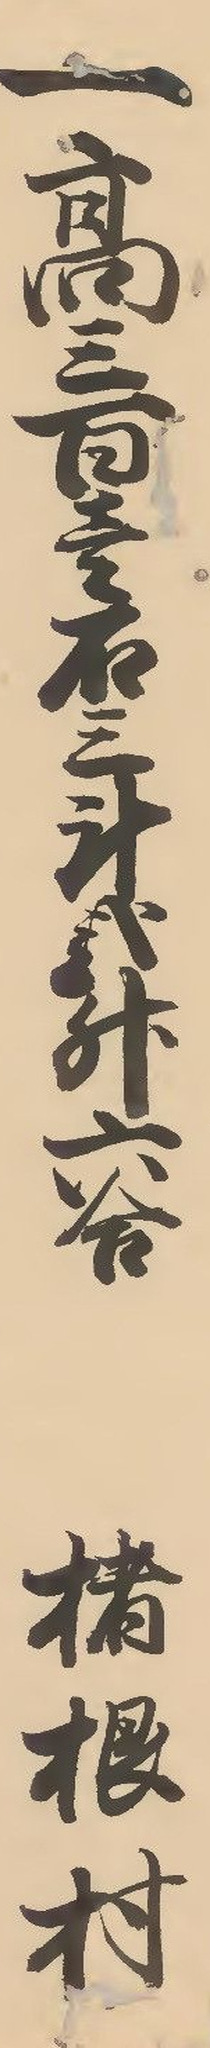一高三百壱石三斗弐升六合楮根村
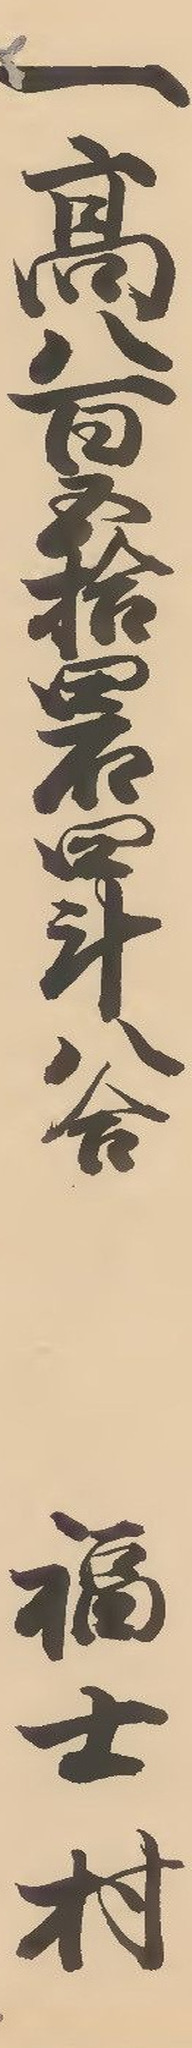一高八百五拾四石四斗八合福士村
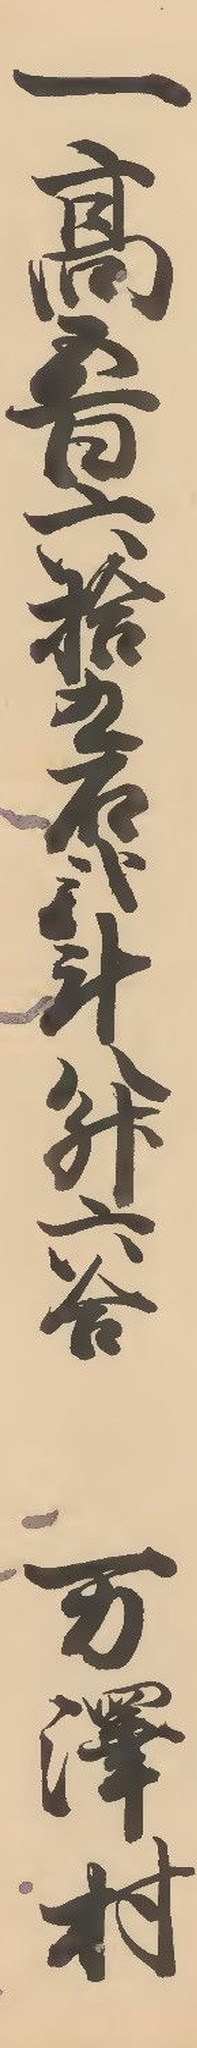一高五百六拾九石弐斗八升六合万沢村

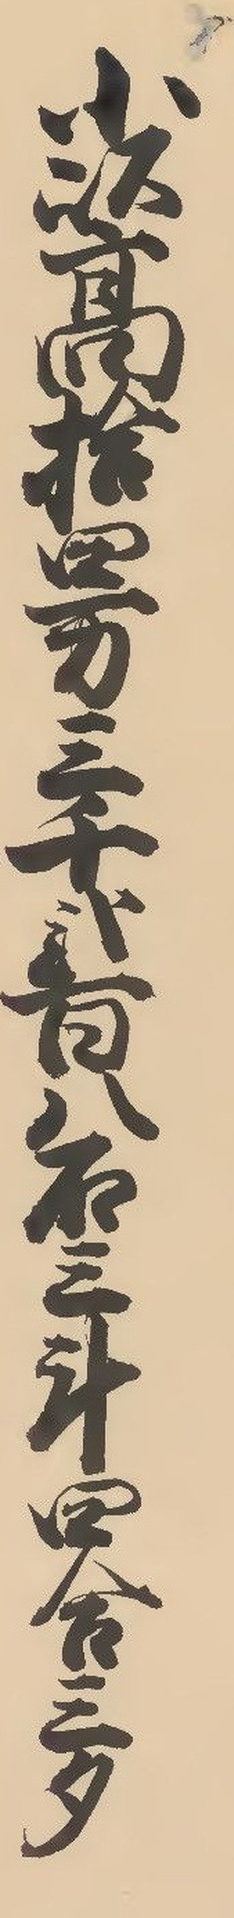小以高拾四万三千弐百八石三斗四合三勺
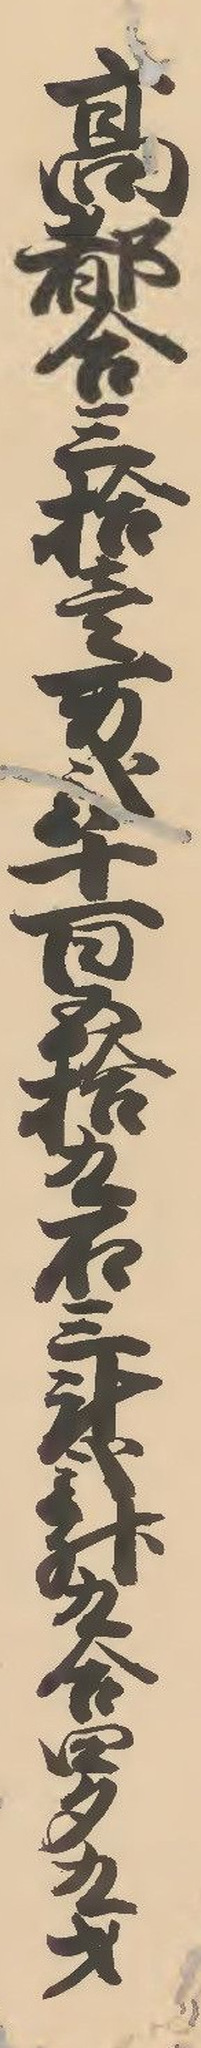高都合三拾壱万弐千百五拾九石三斗弐升九合四勺九才
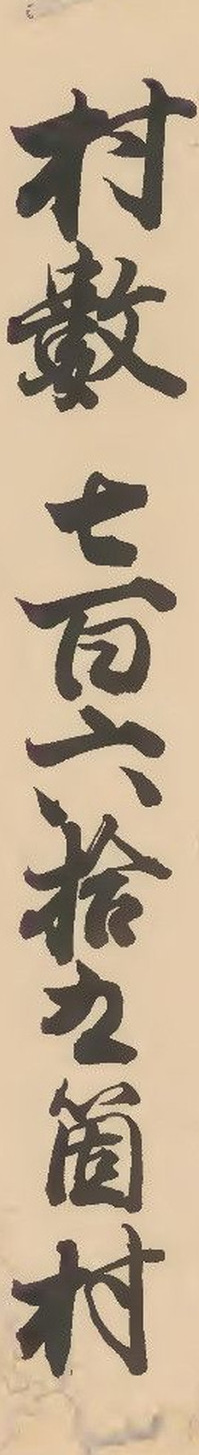村数七百六拾九箇村
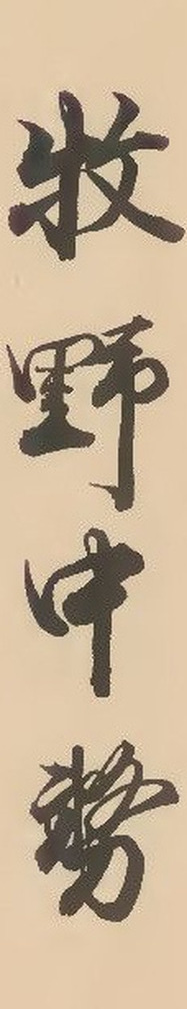牧野中務
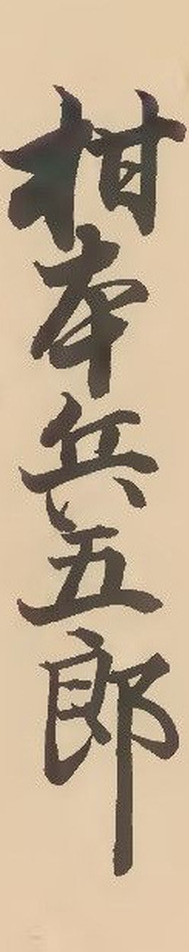柑本兵五郎
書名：甲斐国郷帳
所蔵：国立公文書館 National Archives of Japan
